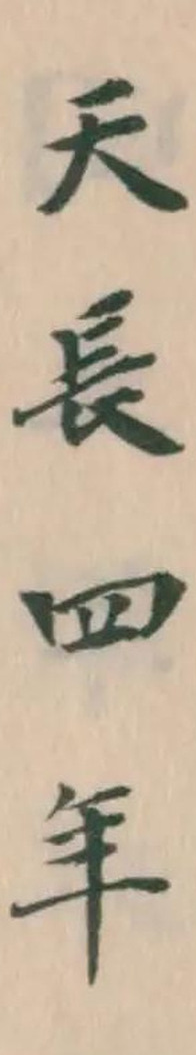天長四年
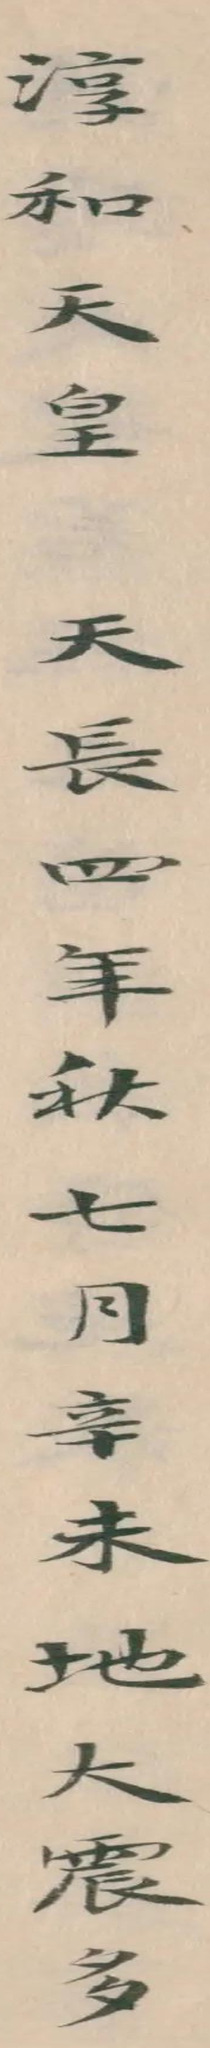淳和天皇天長四年秋七月辛未地大震多
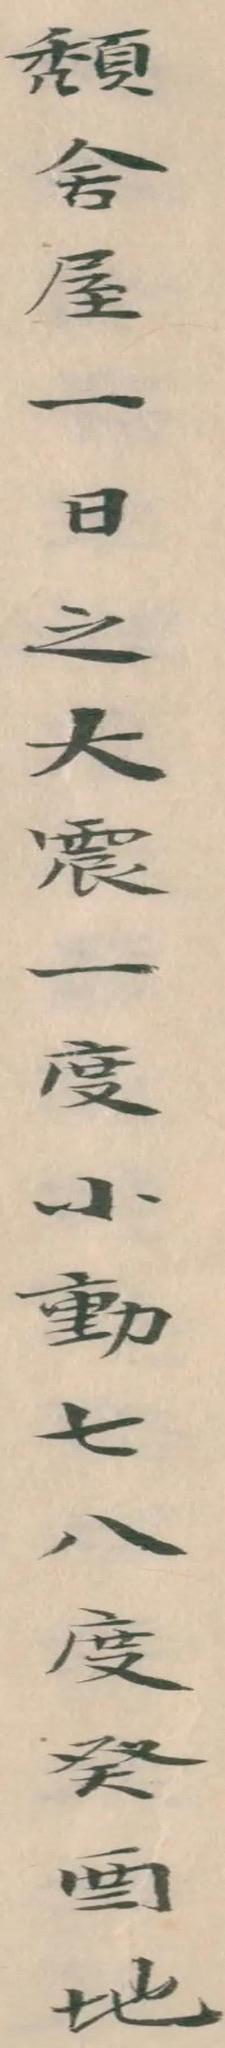頽舎屋一日之大震一度小動七八度癸酉地
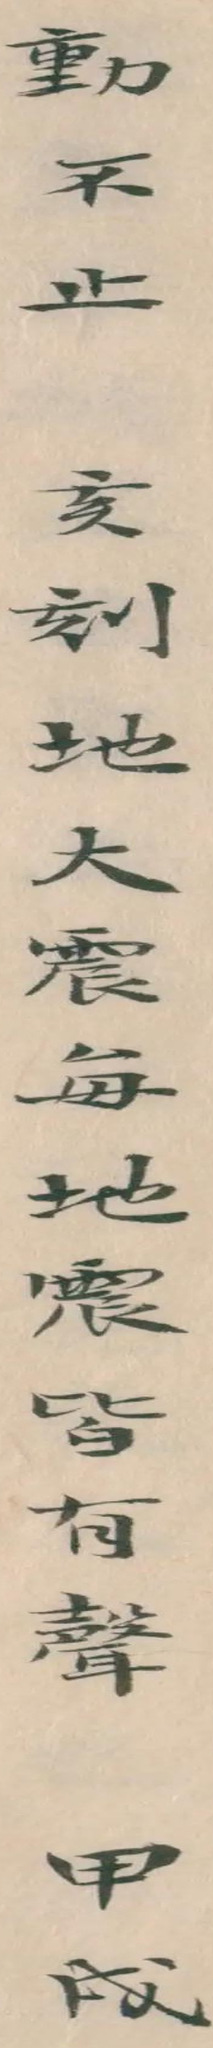動不止亥刻地大震毎地震皆有声甲戌
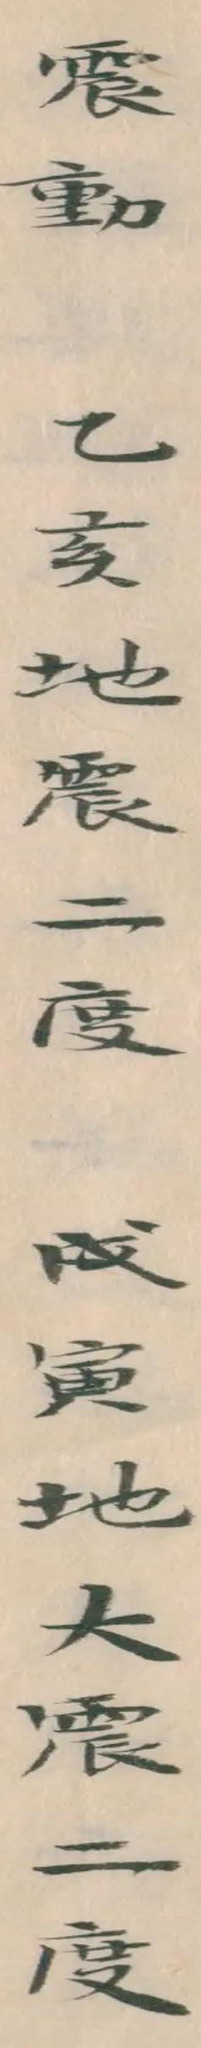震動乙亥地震二度戊寅地大震二度
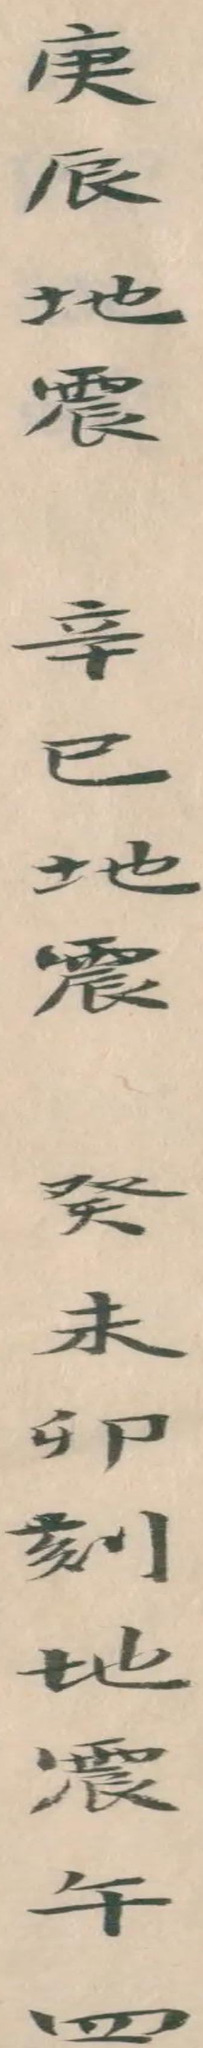庚辰地震辛巳地震癸未卯刻地震午四
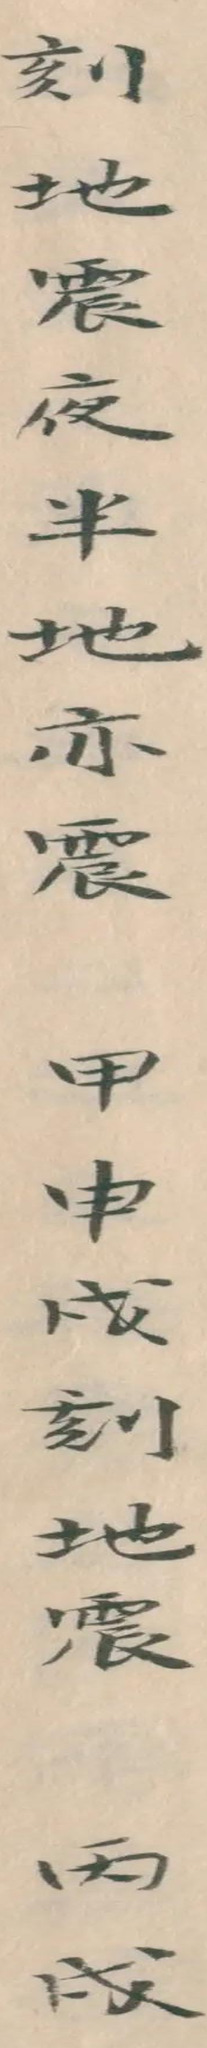刻地震夜半地亦震甲申戌刻地震丙戌

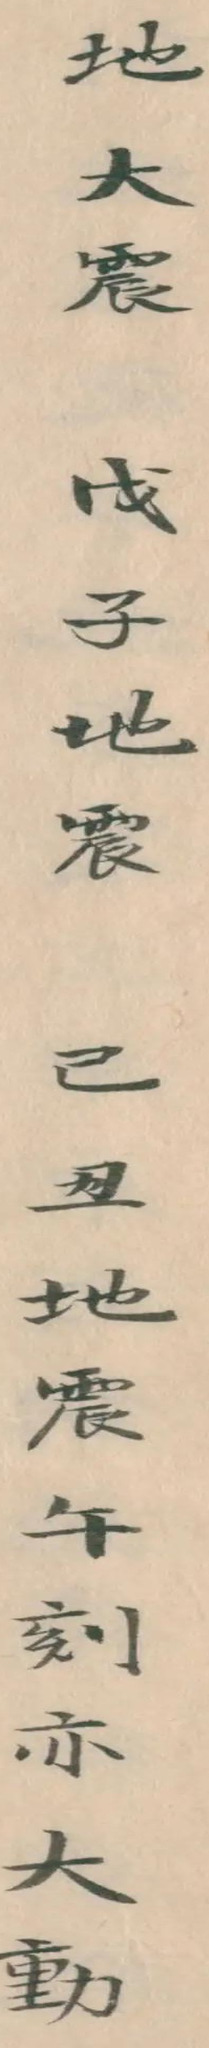地大震戊子地震己丑地震午刻亦大動
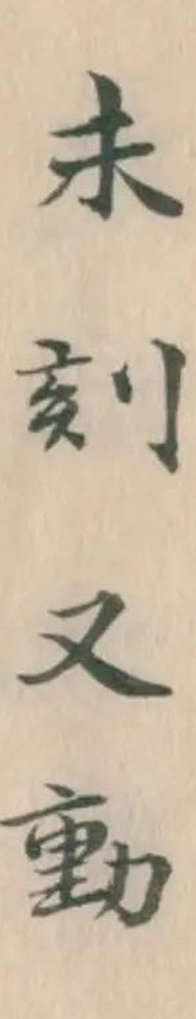未刻又動
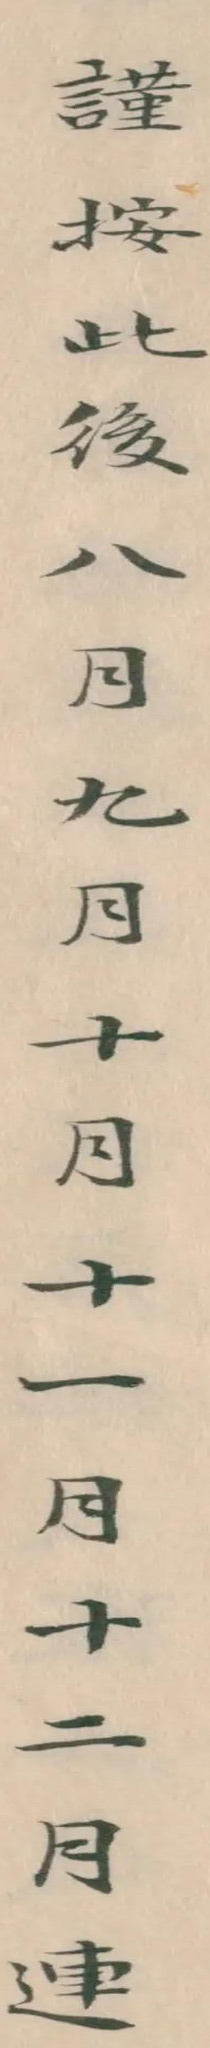謹按此後八月九月十月十一月十二月連
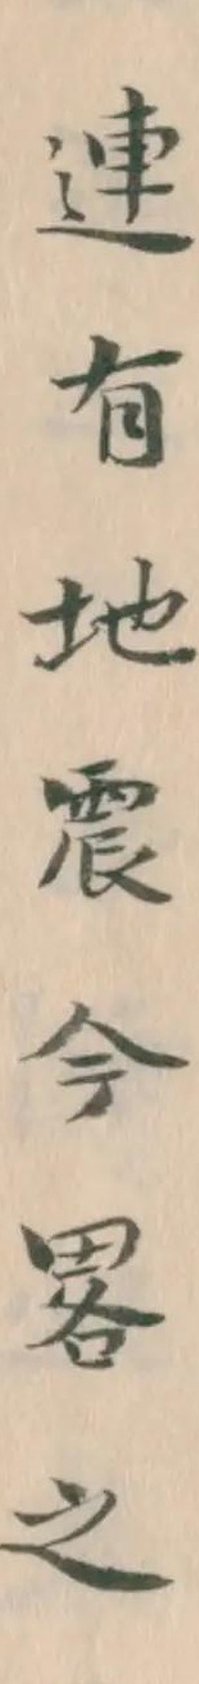連有地震今略之
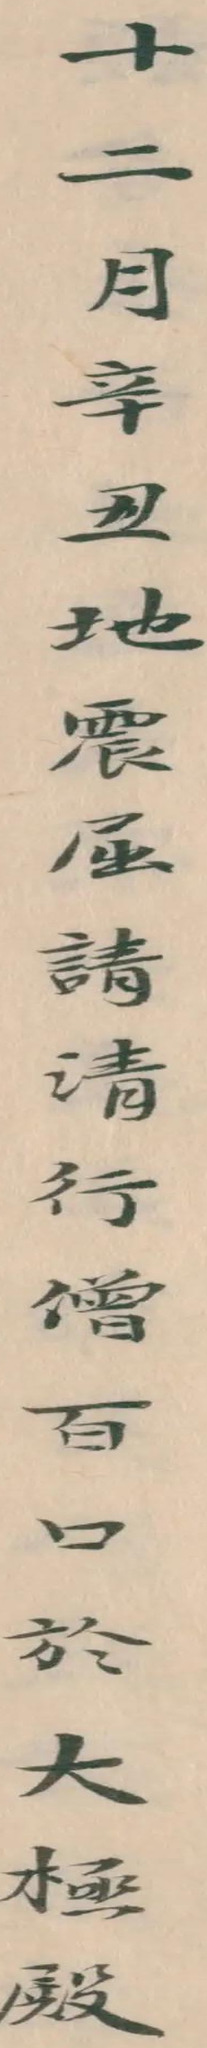十二月辛丑地震屈請清行僧百口於大極殿
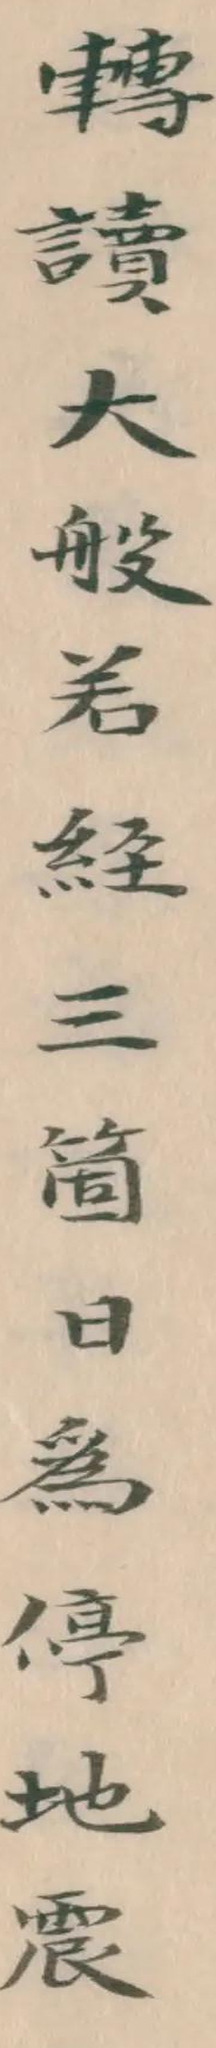転読大般若経三箇日爲停地震
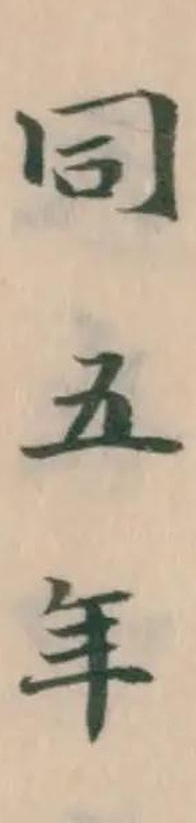同五年
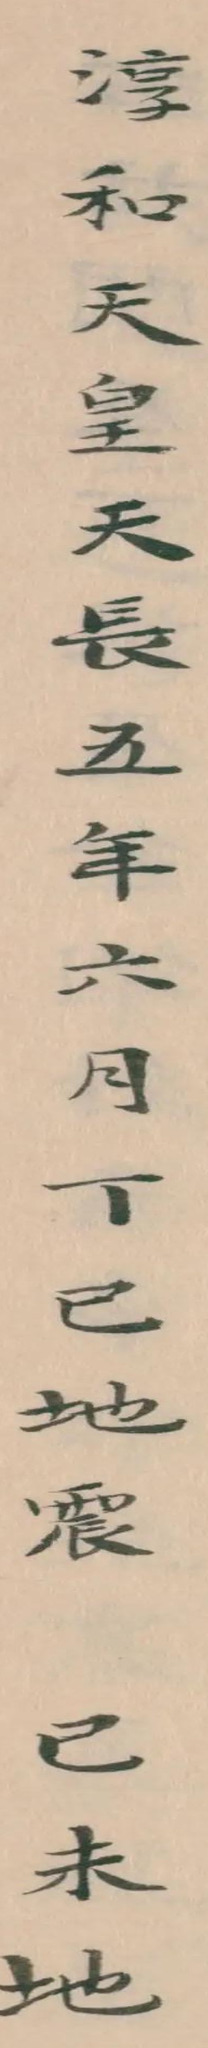淳和天皇天長五年六月丁巳地震己未地
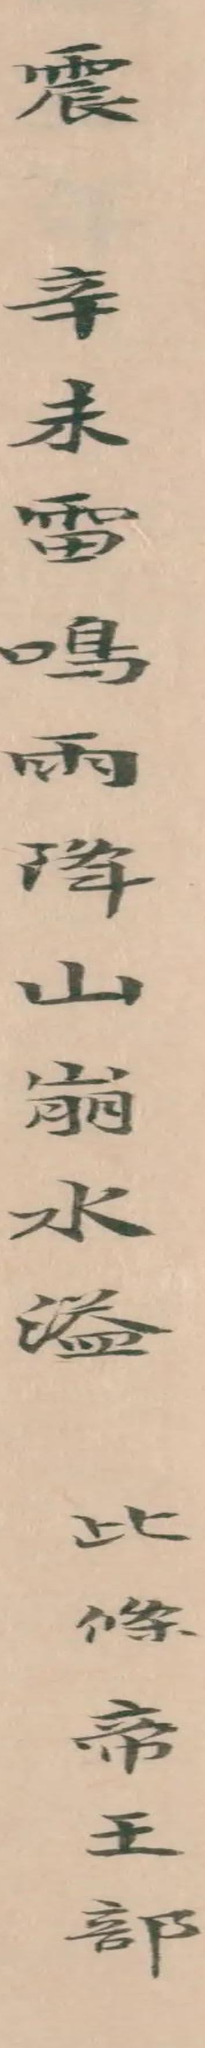震辛未雷鳴雨降山崩水溢此條帝王部
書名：地災撮要. 巻5-6(地震之部)
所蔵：国立国会図書館 National Diet Library, JAPAN
